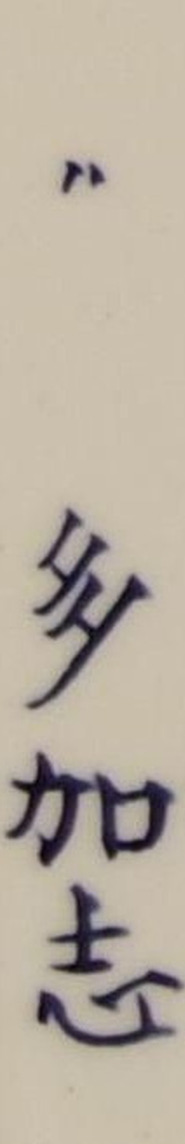多加志
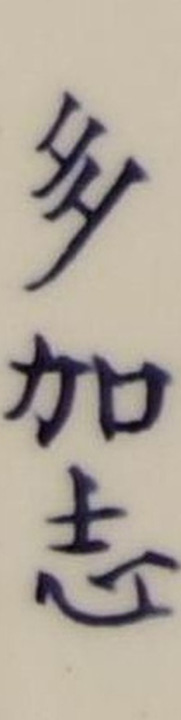多加志

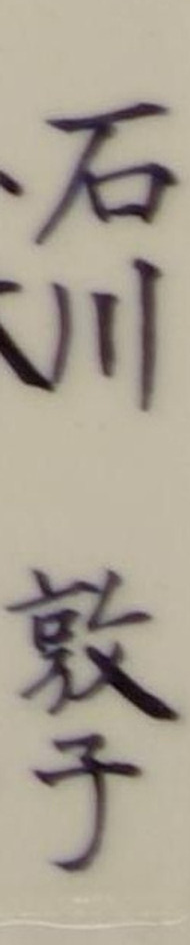石川敦子
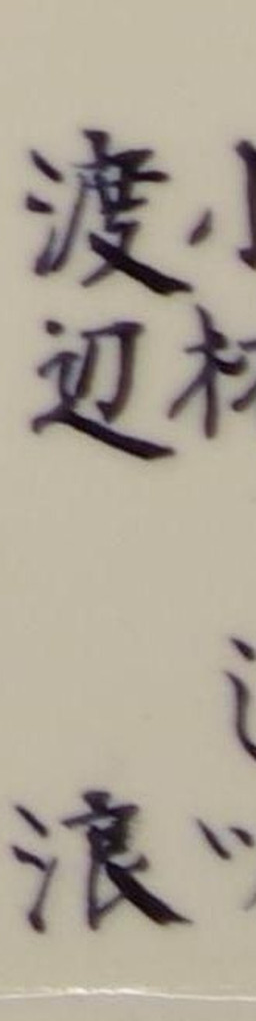渡辺浪
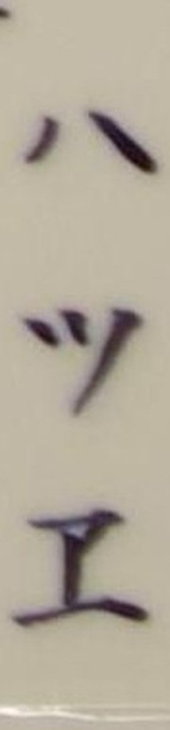八ツヱ
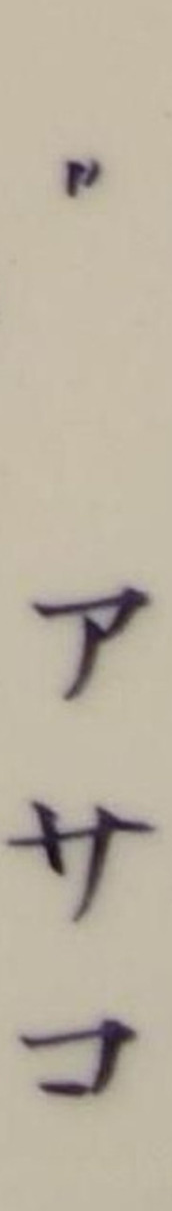アサコ
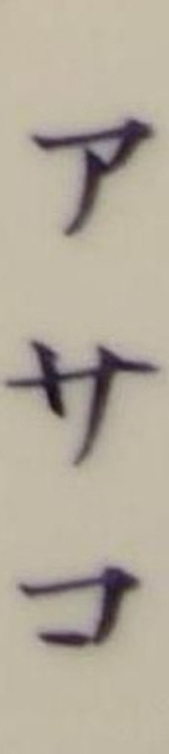アサコ
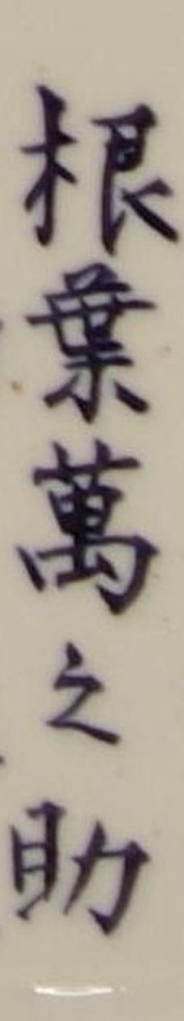根葉万之助
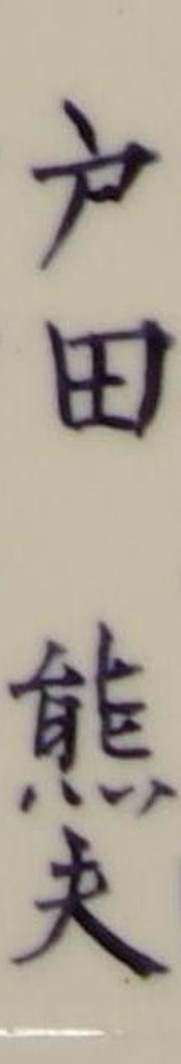戸田熊夫
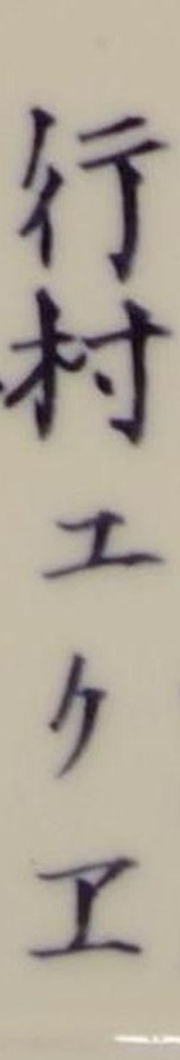行村ユクヱ
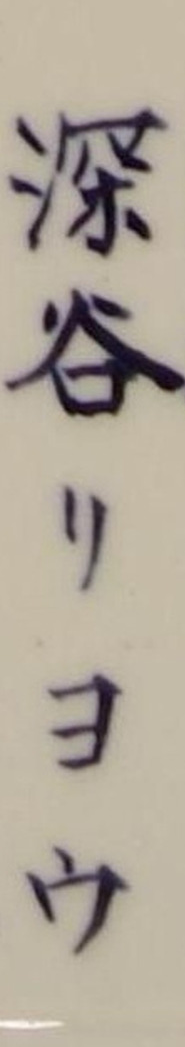深谷リヨウ
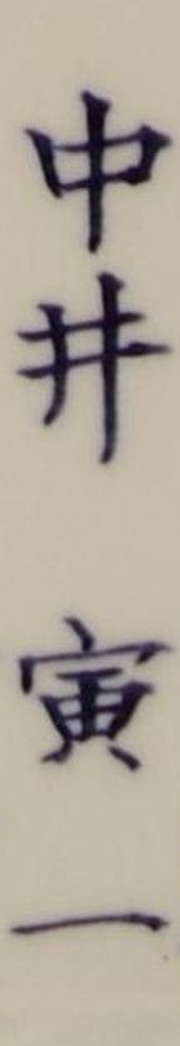中井寅一
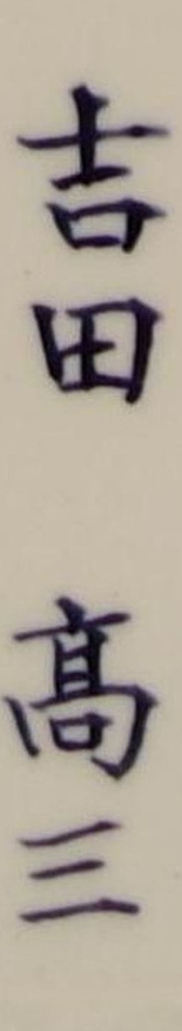吉田高三
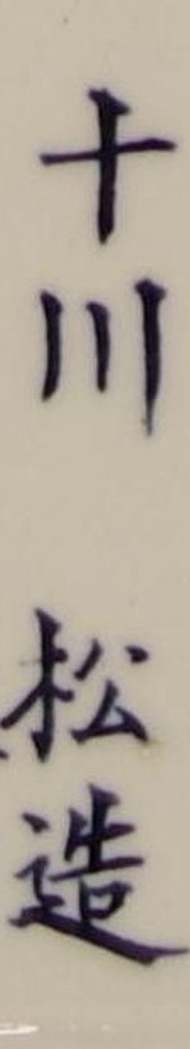十川松造
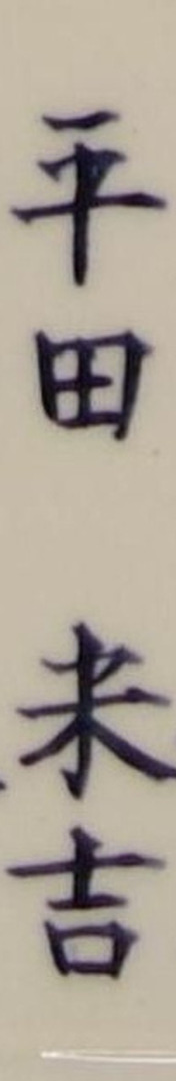平田米吉
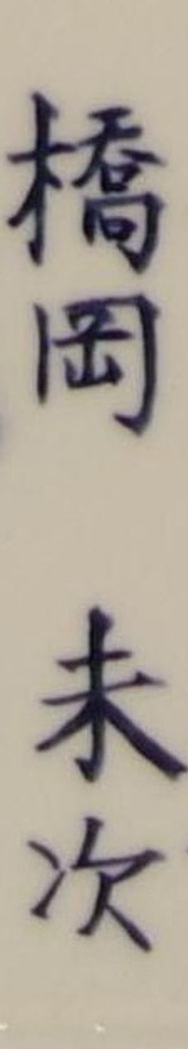橋岡未次
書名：E~L
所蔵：高野山金剛峯寺
